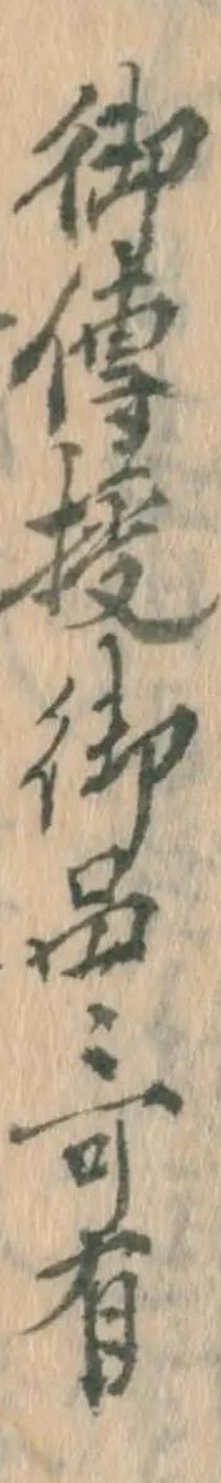御傳授御品々可有
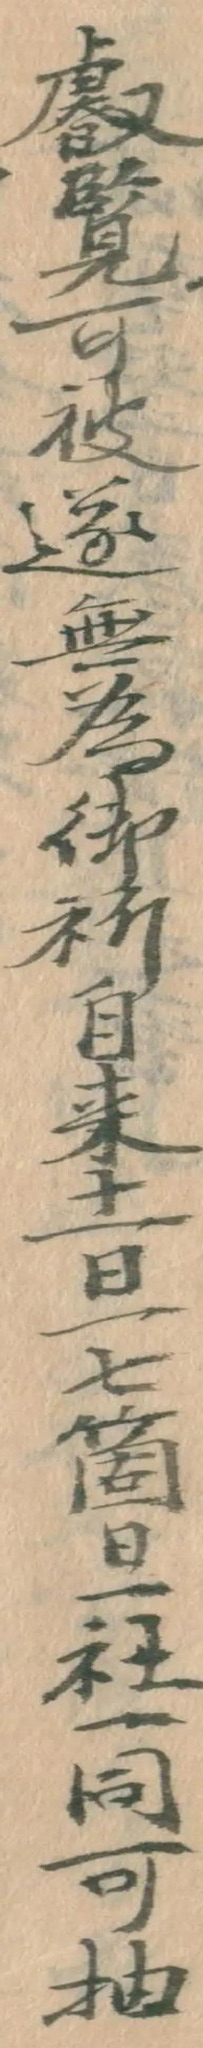叡覧可被遂無為御祈自来十一日一七箇日一社一同可抽
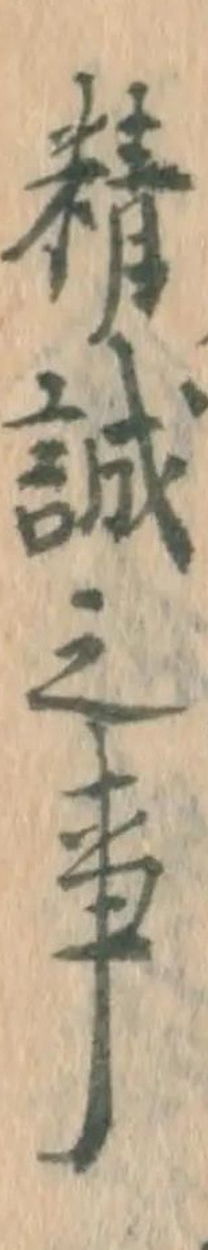精誠之事

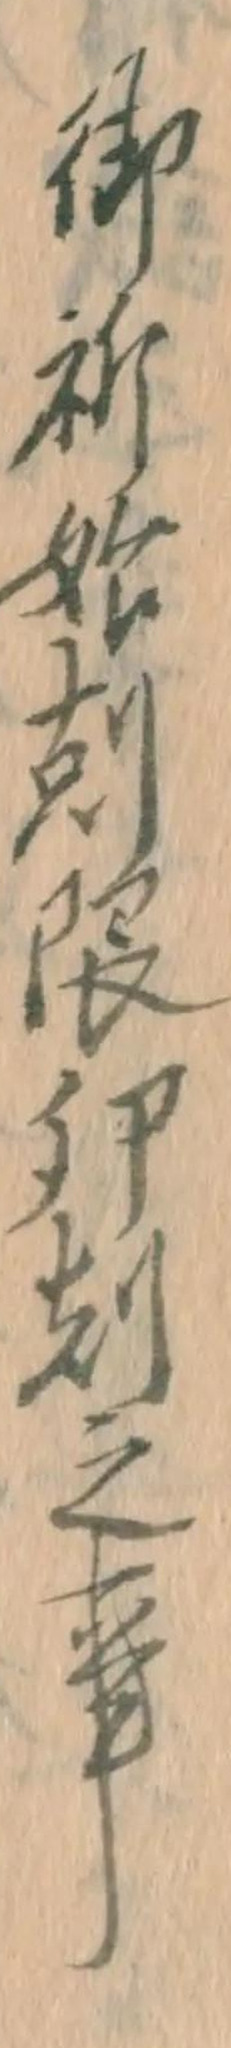御祈始剋限卯刻之事
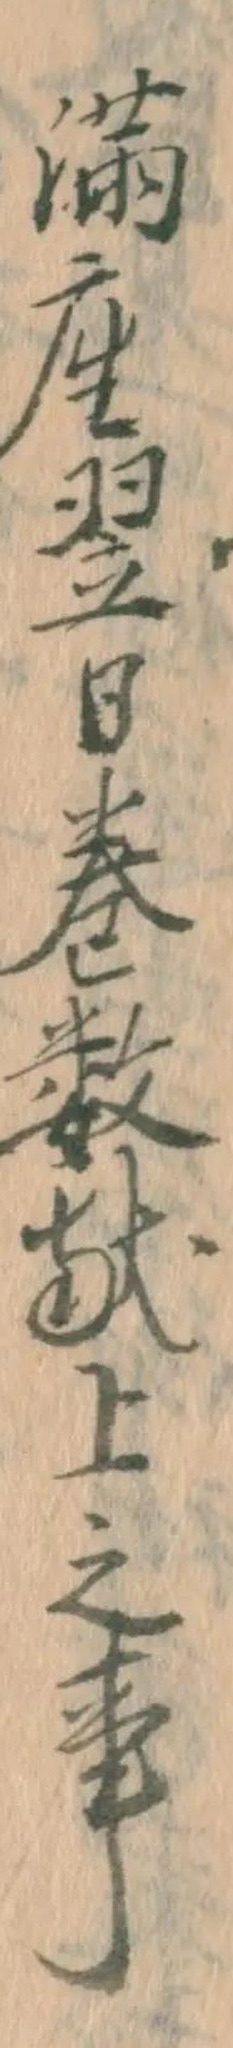満座翌日巻数献上之事
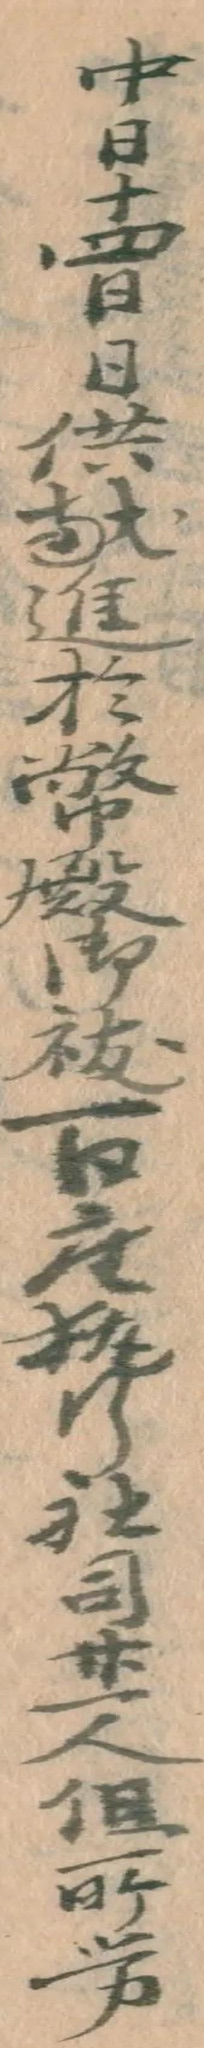中日十四日日供献進於幣殿御祓百座執行社司廿一人但所労
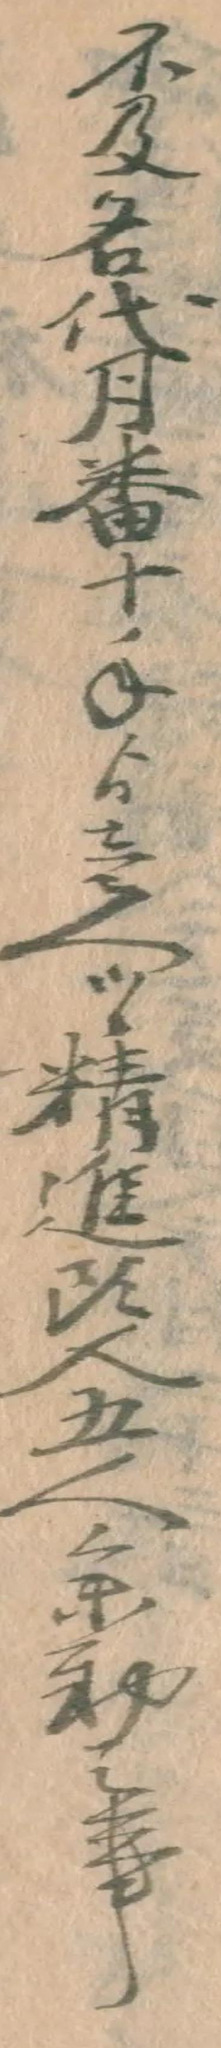不及各代月番十手ゟ壱人ツヽ精進頭人五人参勤之事
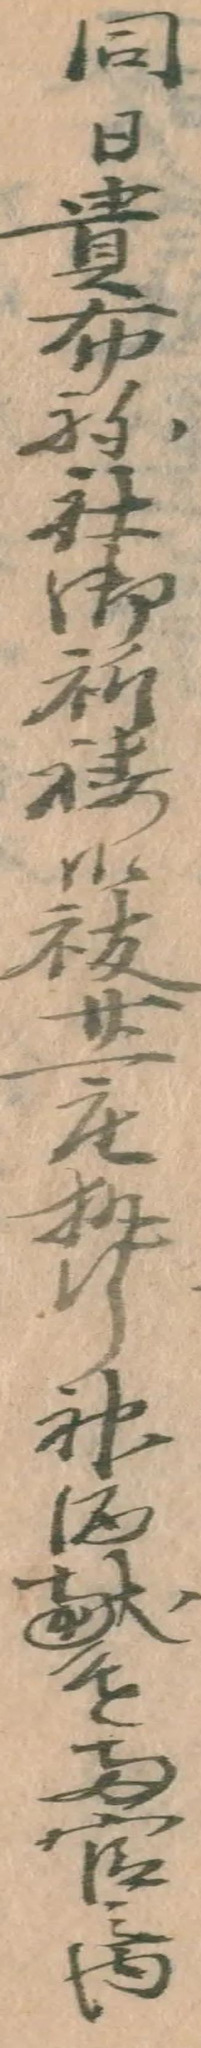同日貴布祢社御祈祷御祓廿一座執行神酒献進両官之内
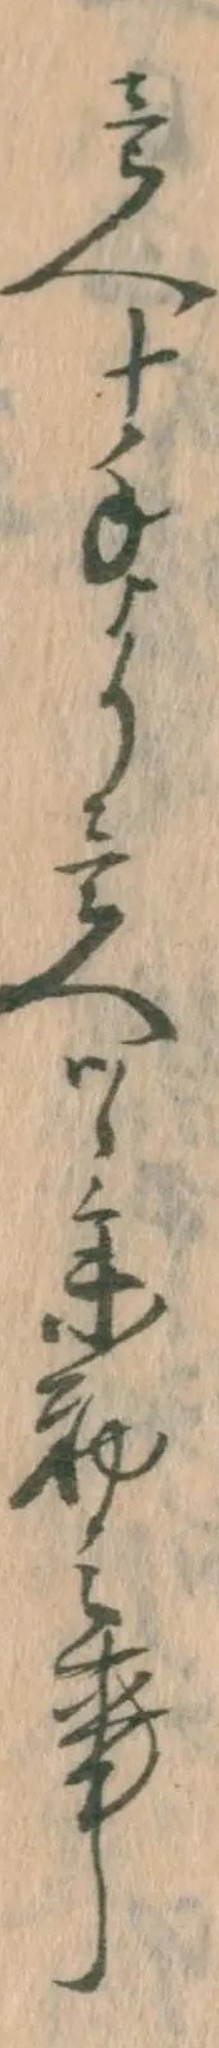壱人十手より壱人ツヽ参勤之事
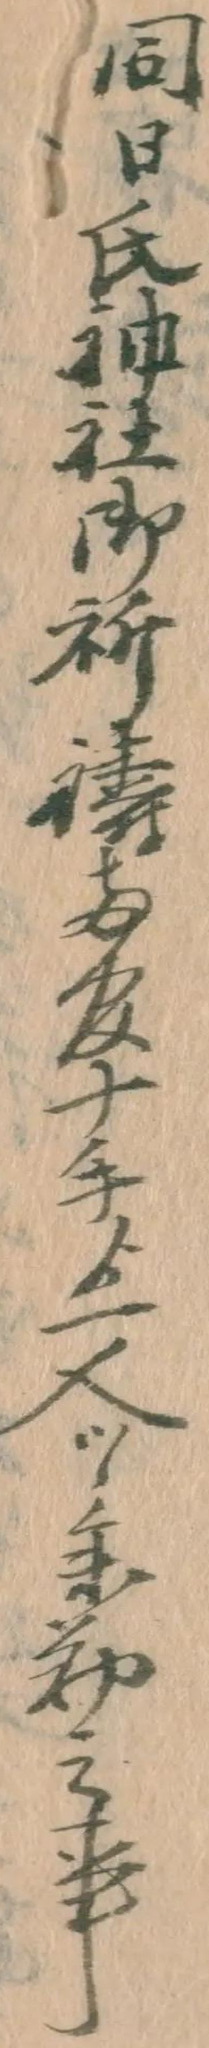同日氏神社御祈祷両官十手ゟ一人ツ参勤之事
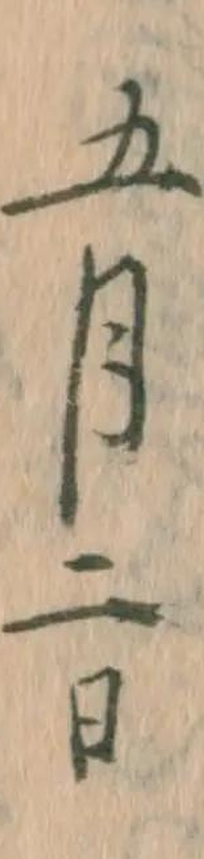五月二日
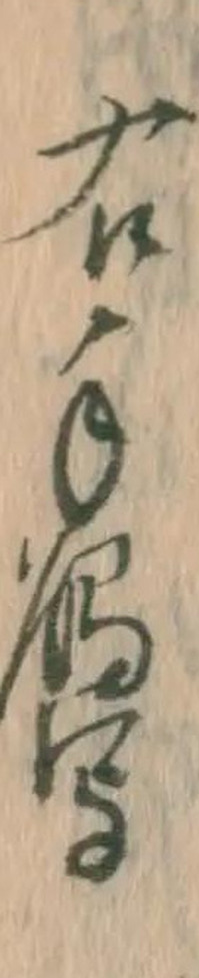右手觸写
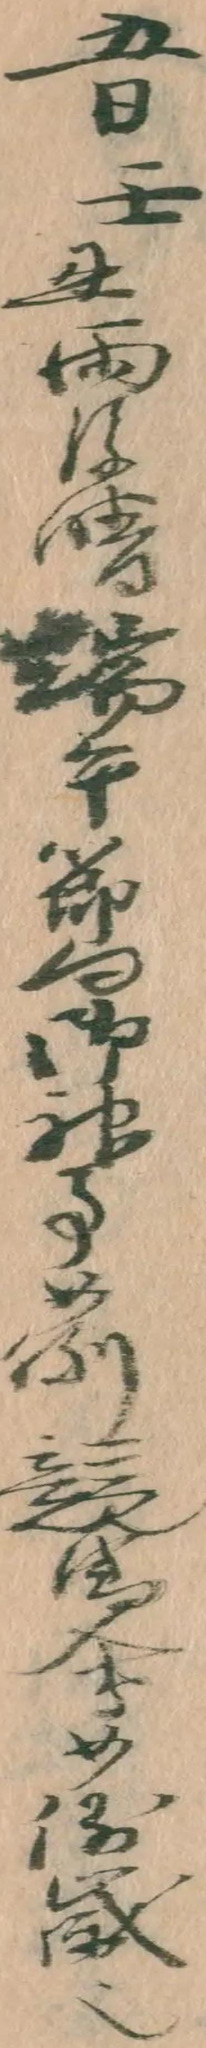五日壬丑雨後晴端午節句御神事如例競馬會如例歳也
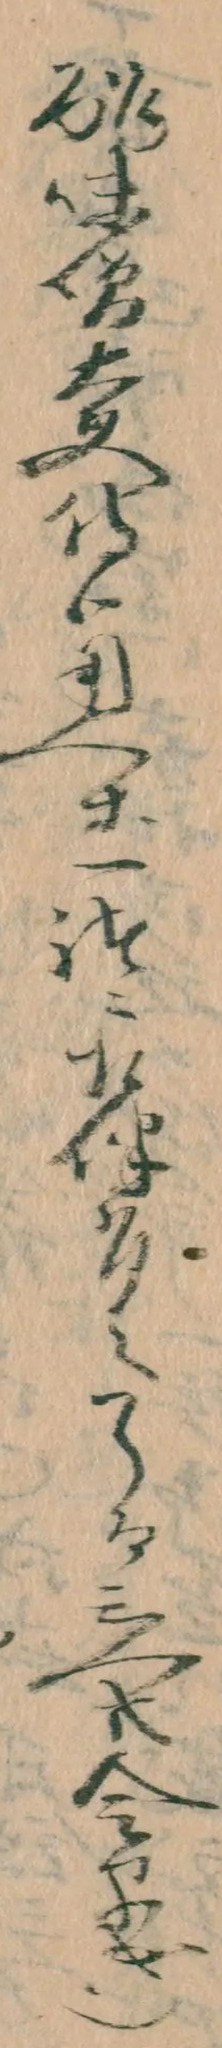酢味噌大夫侍御用人等一躰ニ相伴有之了而三人共令早出也
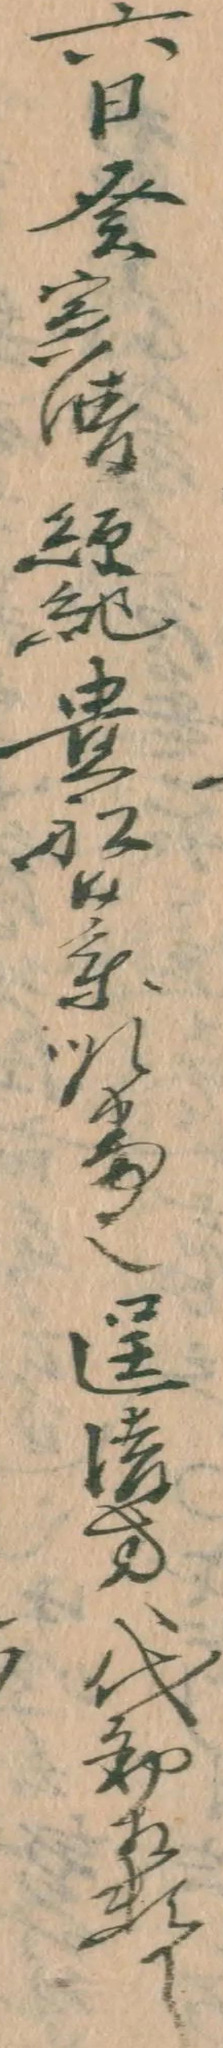六日癸寅晴経紀豊舩日参順番也逞清方へ代勤相頼了
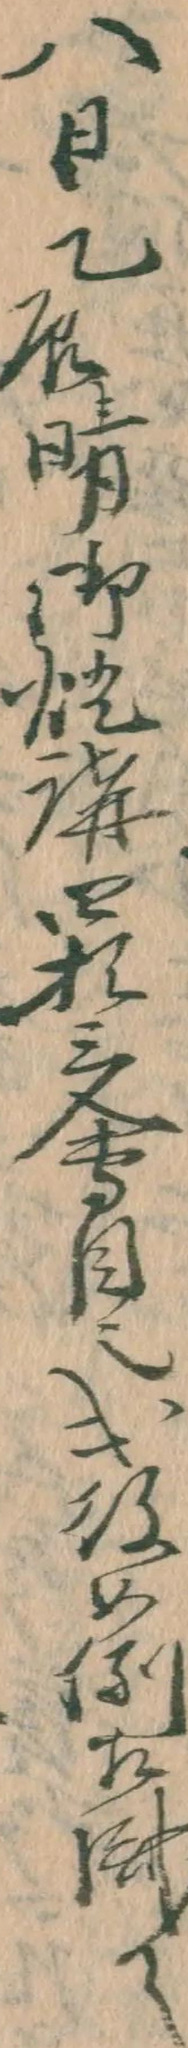八日乙辰晴御燈講四拾三會目也出役如例相済了
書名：賀茂社記録. 第69冊
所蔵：国立国会図書館 National Diet Library, JAPAN
